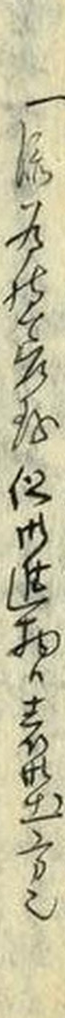添為持差越但御進物ハ表御出方也
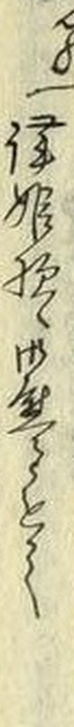謹姫様へ御慰ニ被進之
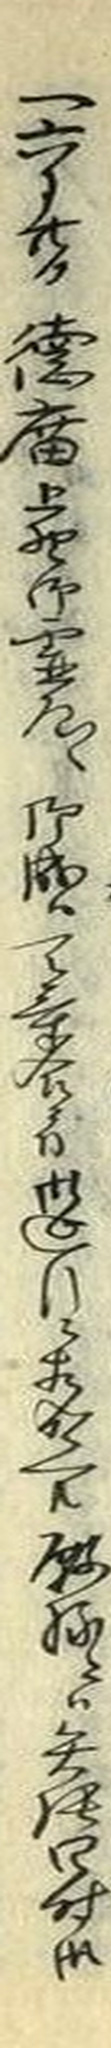一六月廿日徳庿上野御霊屋へ御成ハ天気合ニ付御延引ニ相成候へ共殿様ニハ矢張四時御
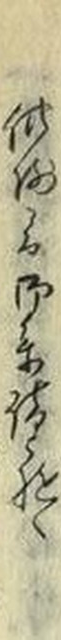供揃ニ而御参詣被遊候
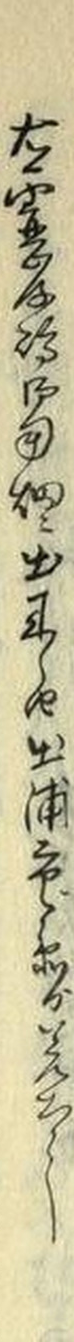右霊岸嶋御用畑ニ出来候由出浦市郎兵衛ゟ差出之
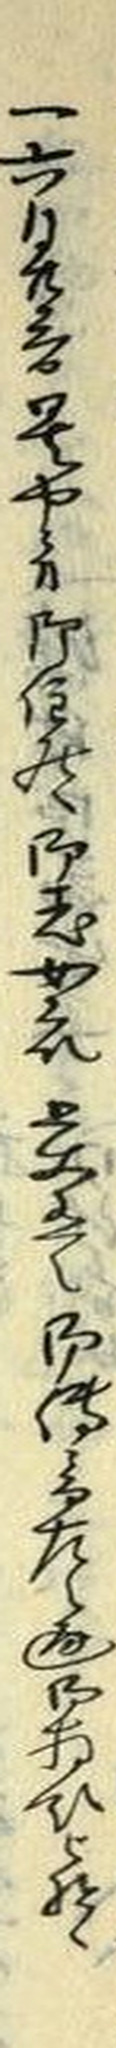一六月廿三日暑中ニ付御住居へ御老女衆上使有之御伝ニ而左之通御拝領被遊候
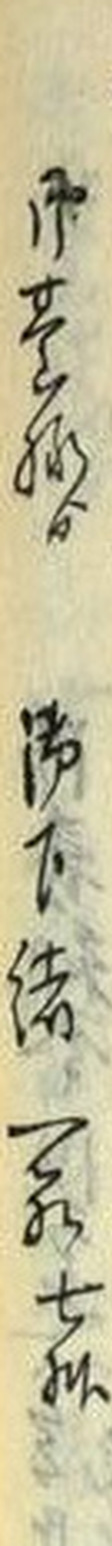御台様ゟ御下緒一箱七掛
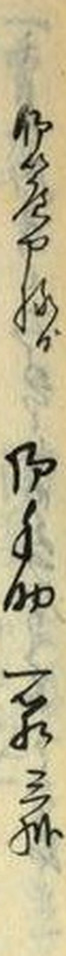御簾中様ゟ御手助一箱三掛
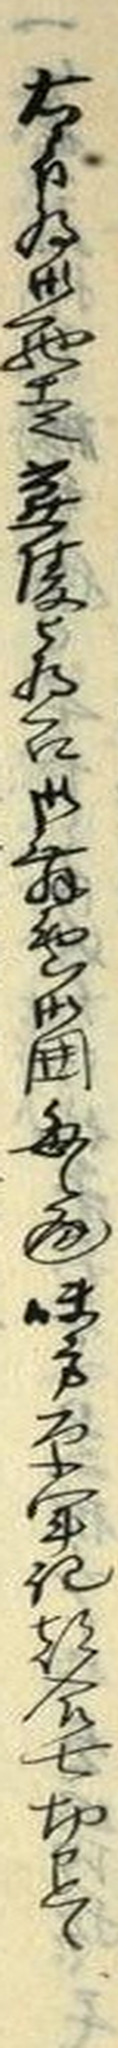右ニ付為御馳走燕凌被為召御舞台御囲毎之通味方原軍記都合七切申上候
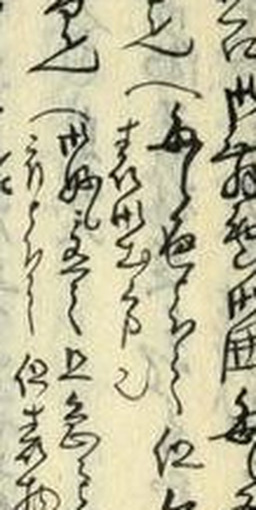表御出方也
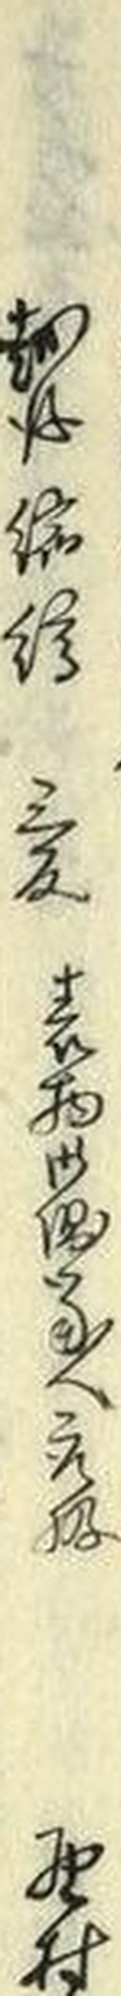越後縮緬三反表物御側御用人取扱野村殿
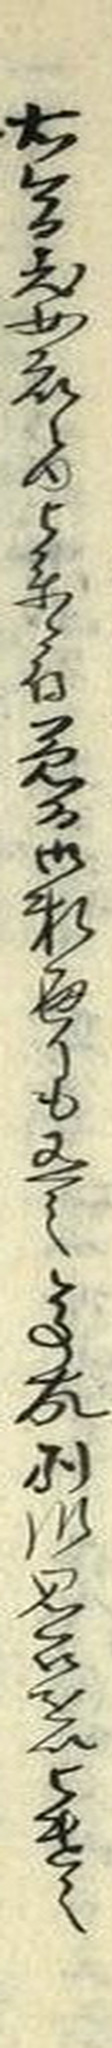右今日老女衆之内被参候ニ付兼而御頼通りも有之候事故別段思召を以被遣之
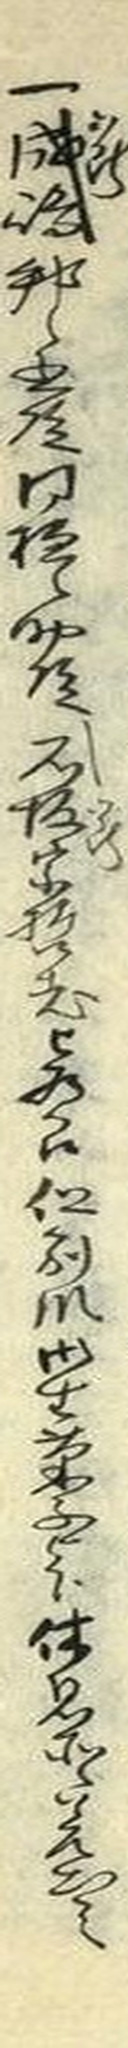一成嶋邦之丞殿同桓之助殿石坂宗哲老被為召但別段御生菓子被下休息所へ差出之
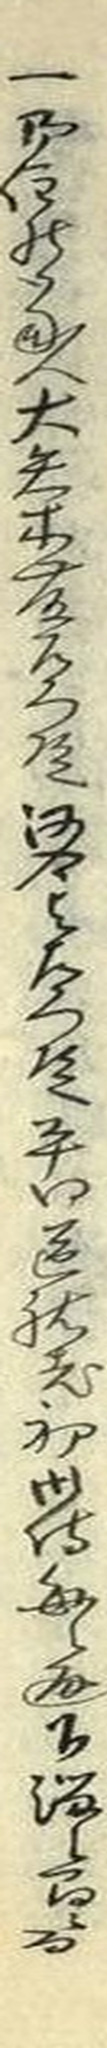一御住居御用人大矢木藤左衛門殿河合与左衛門殿平田道祐老初御侍毎之通下溜之間ニ而
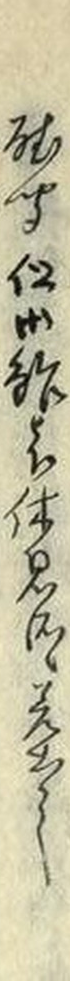聴聞但御鮓被下休息所へ差出之
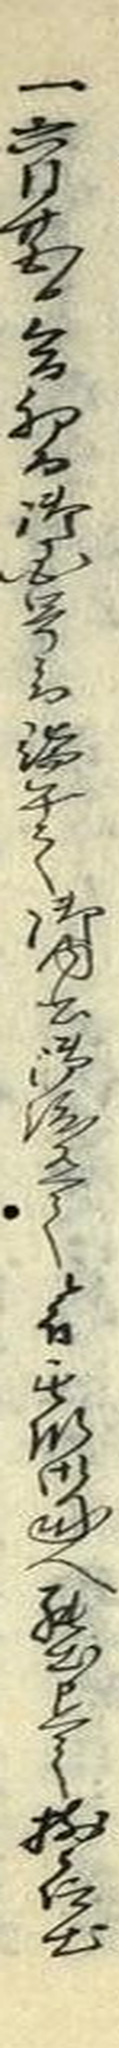一六月廿五日今日初而御国号ニ而端午之御内書御渡有之候ニ付其段御用人罷出申上之揃被仰出
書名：少傅日録抄（斉善付側向頭取日記、在府）
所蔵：福井県文書館 Fukui Prefectural Archives
